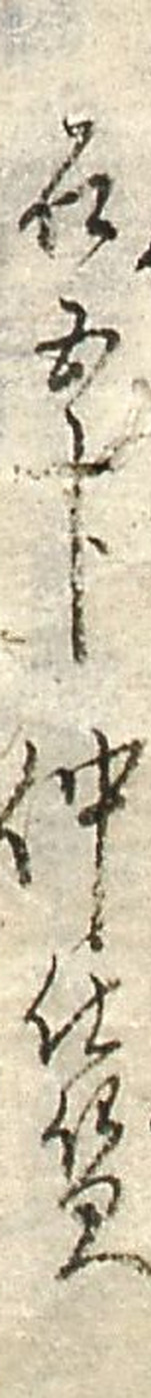石五分仲仕賃
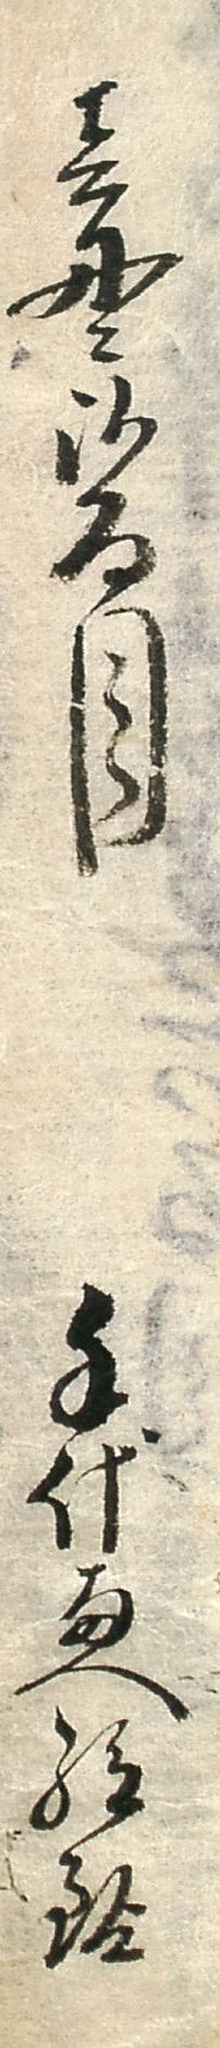壱貫弐百目手代両人給銀
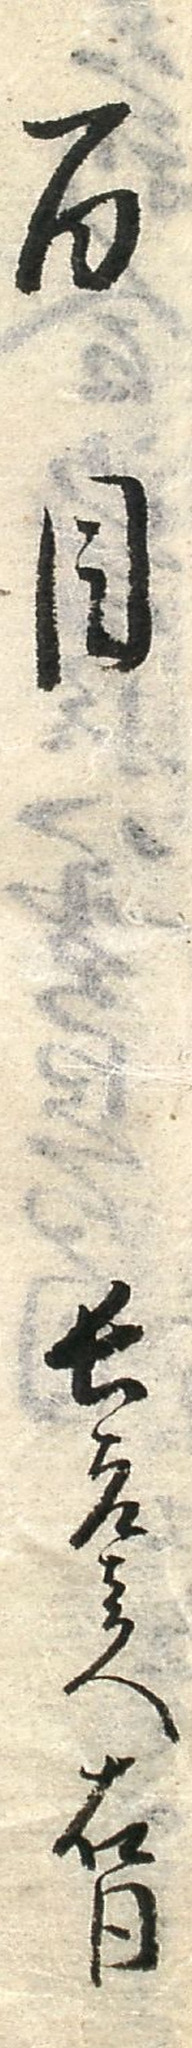百目長老壱人右同
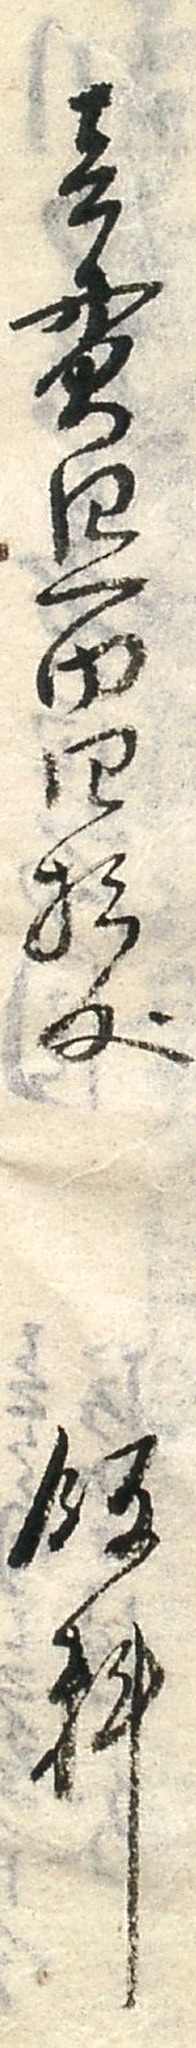壱貫四百四拾匁飯料
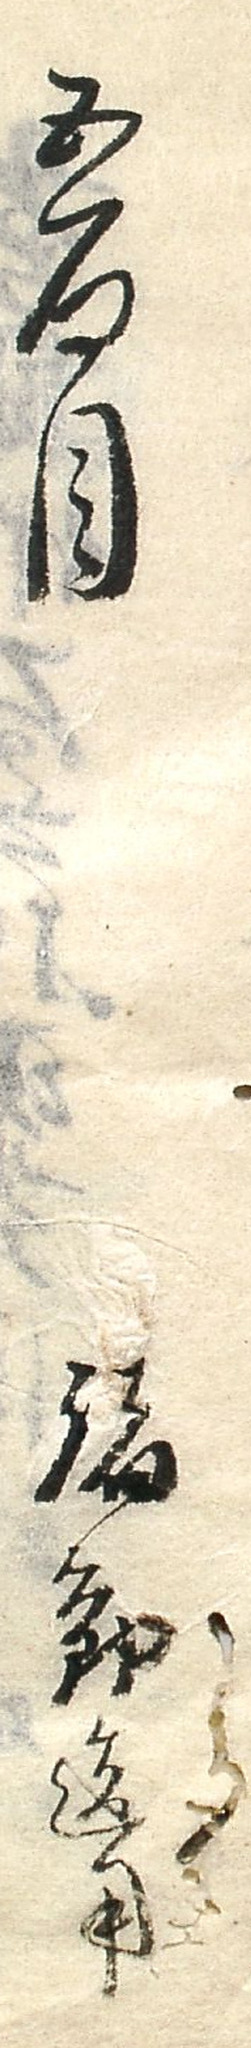五百目諸勤造用
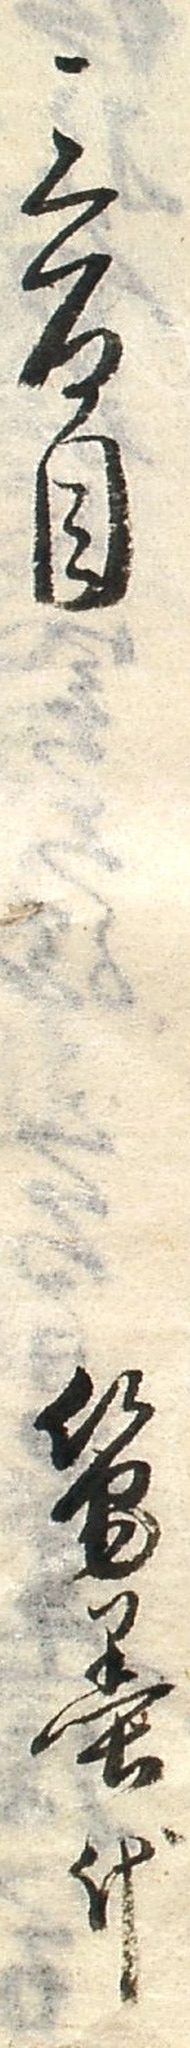三百目筆墨代
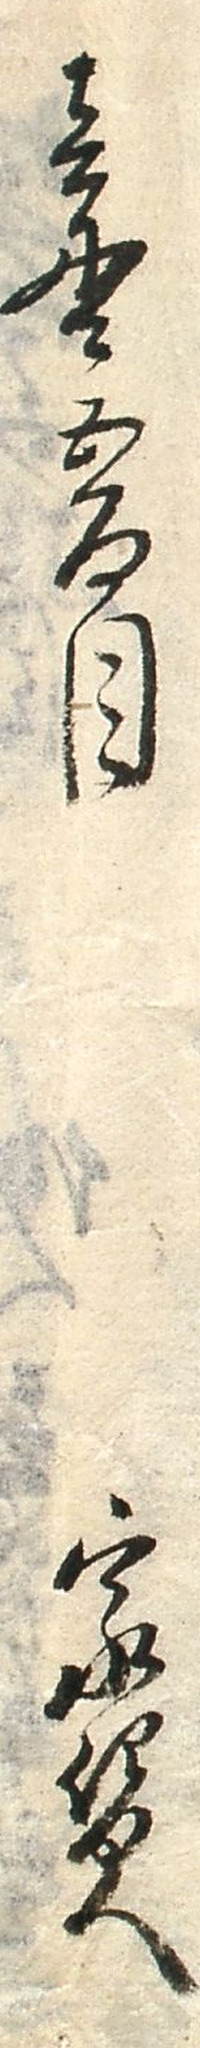壱貫五百目家賃
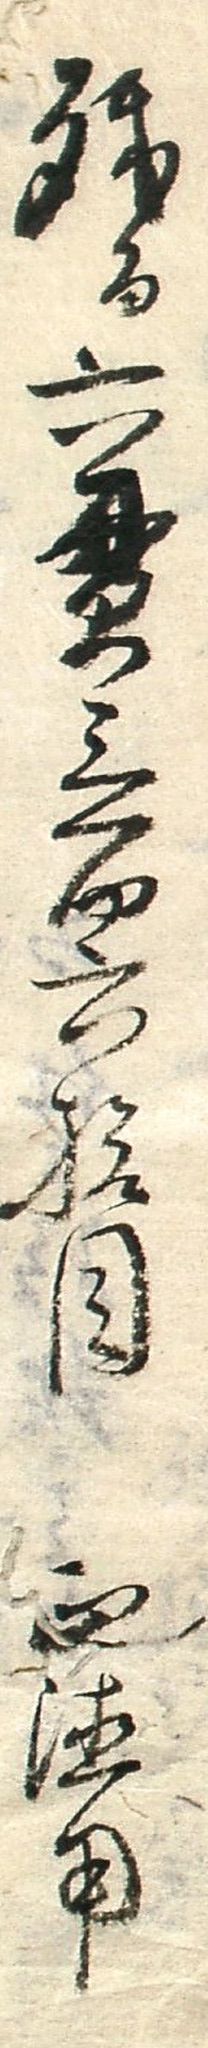残て六貫三百六拾目正徳用
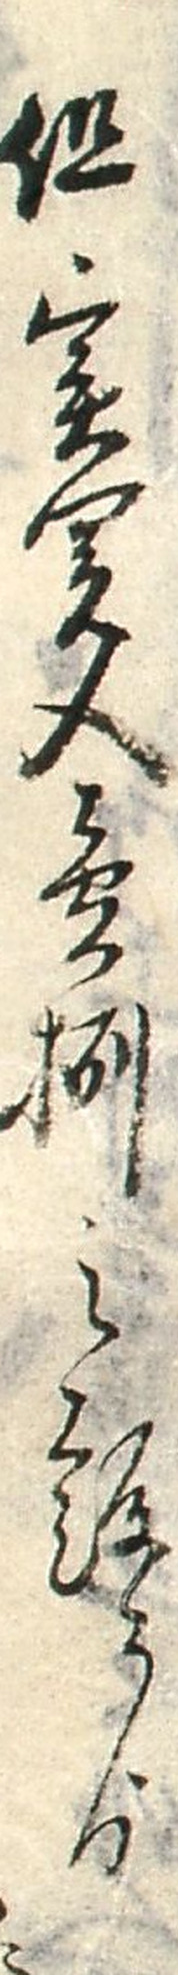但実買入売捌之趣にゟ
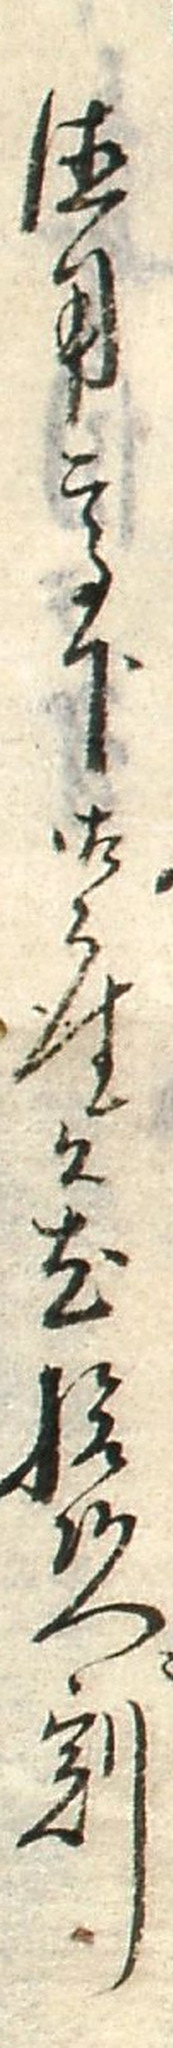徳用高下御座候尤拾弐人に割

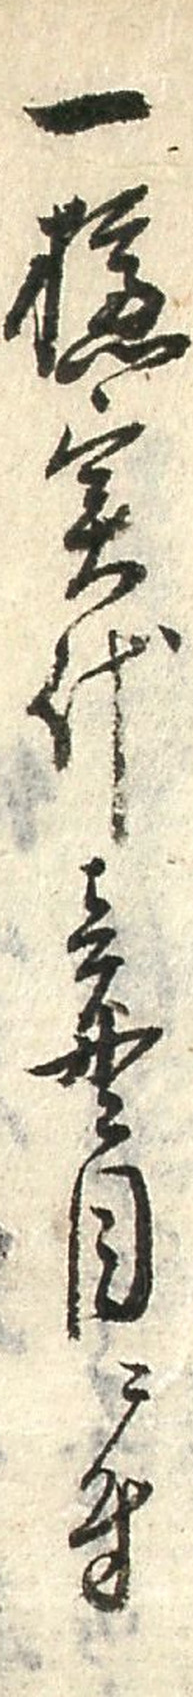一櫨実代壱貫目に付
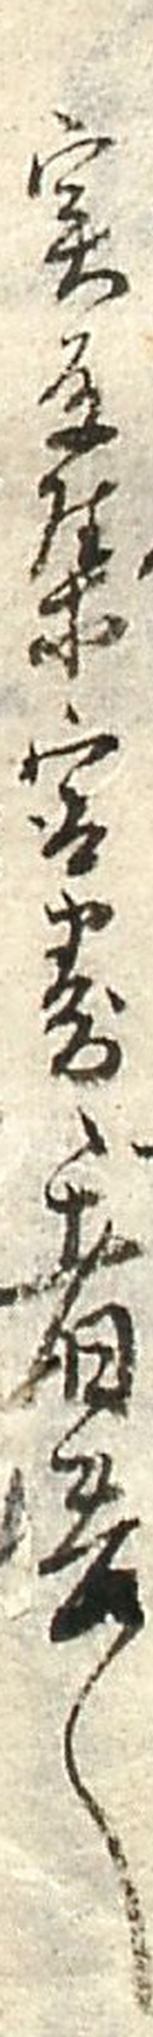実取集最寄之者共へ
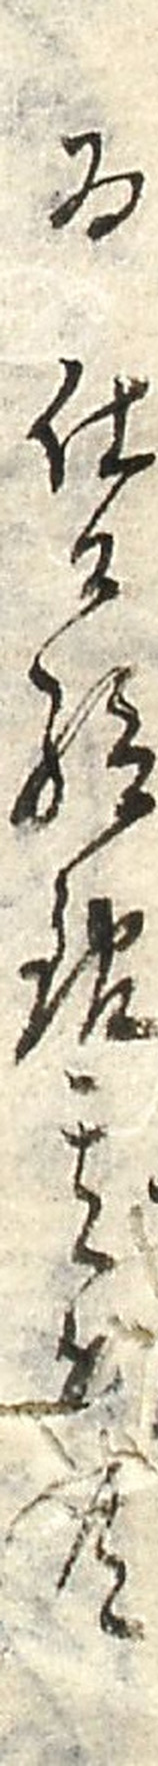為仕候給銀其外共
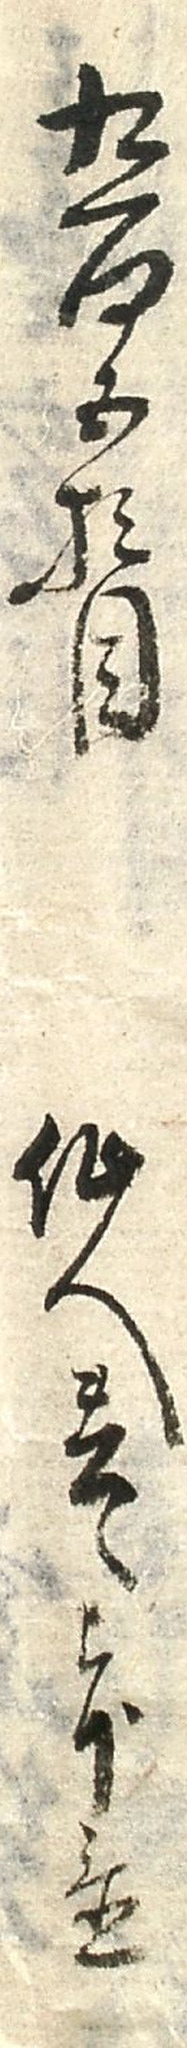九百五拾目作人共へ被下置
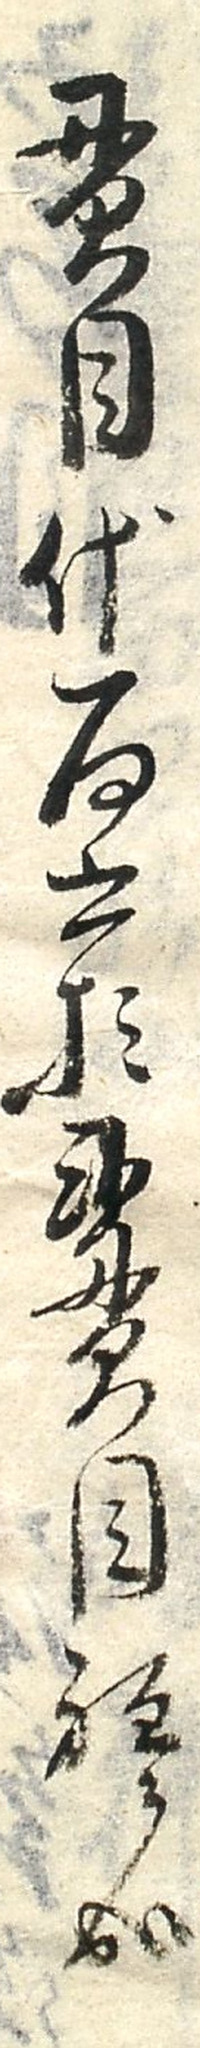貫目代百六拾弐貫目程に成
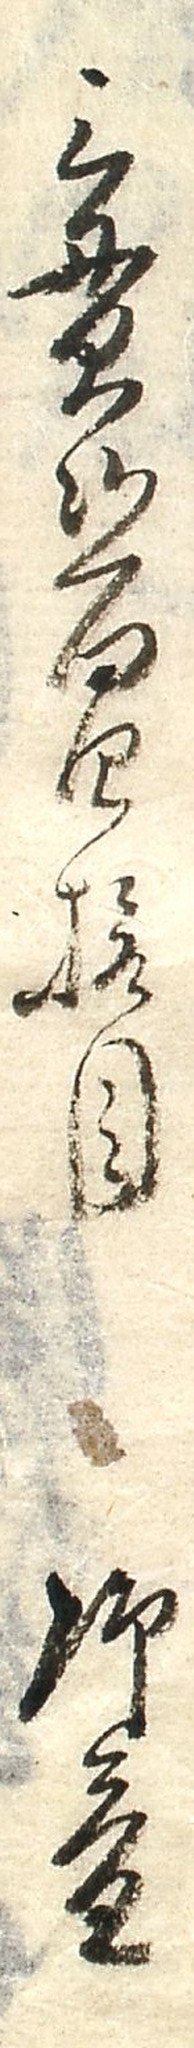三貫弐百四拾目御益
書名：櫨実絞方実代指引算用書
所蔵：鳴門教育大学 Naruto University of Education
